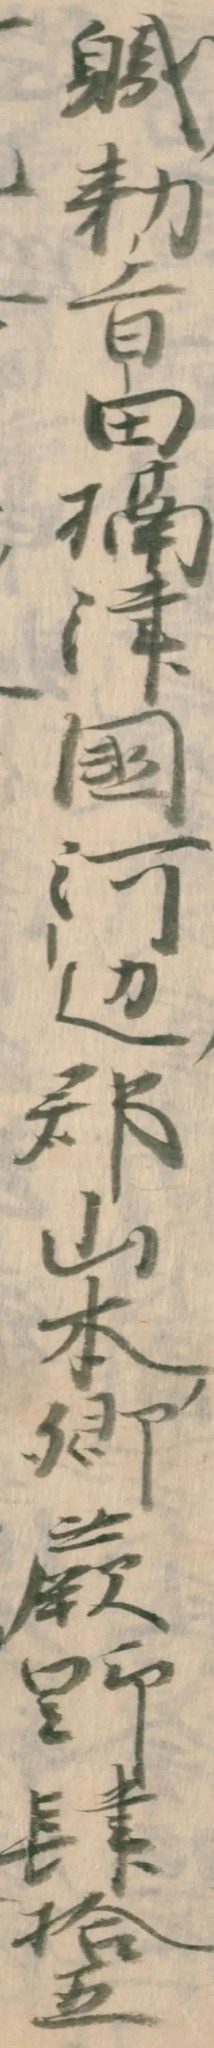職勅-旨-田摂津国河-辺郡山本郷蕨-野肆拾五

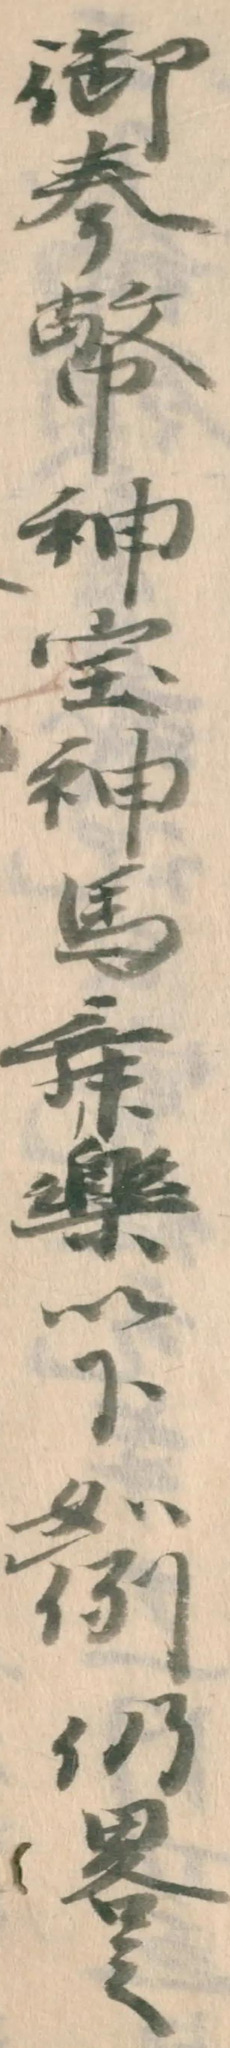御奉幣神宝神馬舞-楽以下如例仍略之
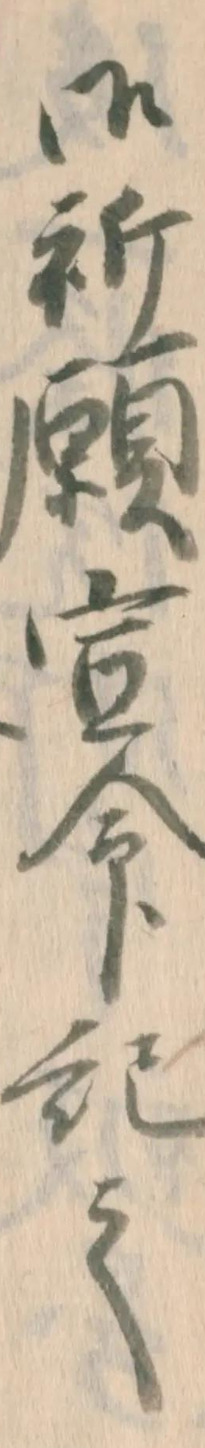御祈願宣命記之
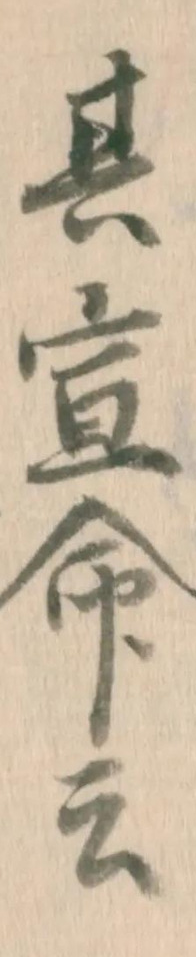其宣命云

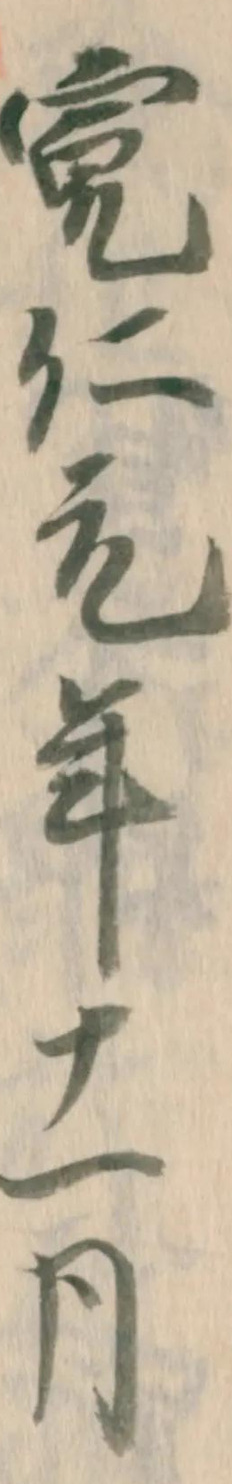寛仁元年十一月
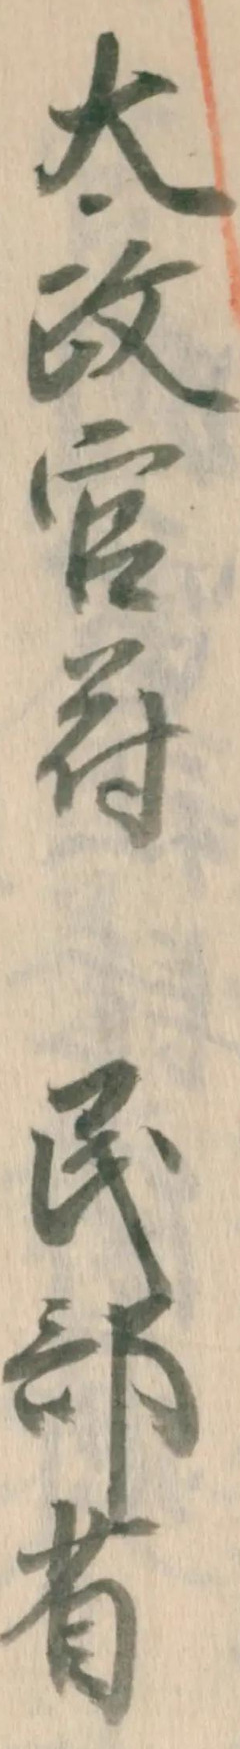太政官符民部省

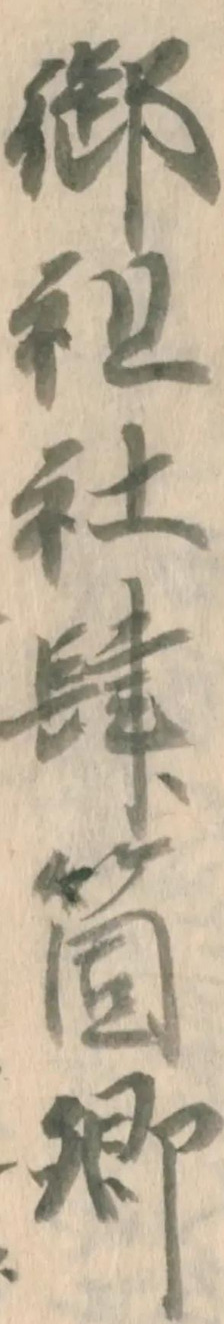御祖社肆箇郷
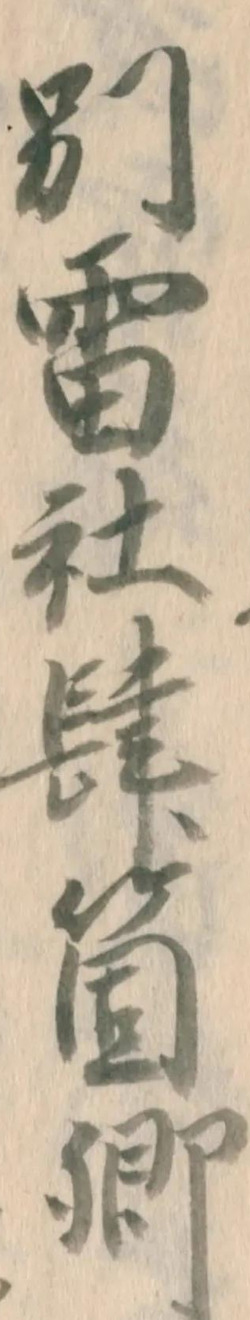別雷社肆箇郷

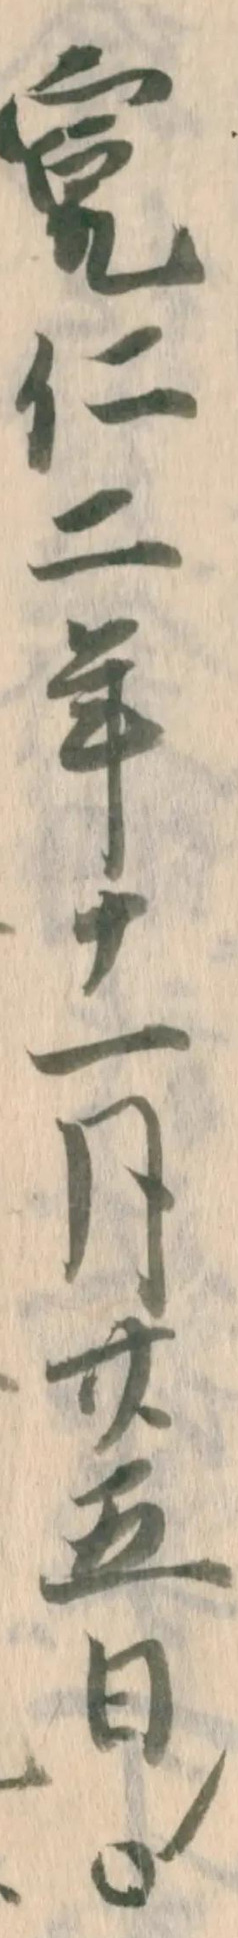寛仁二年十一月廿五日◦)
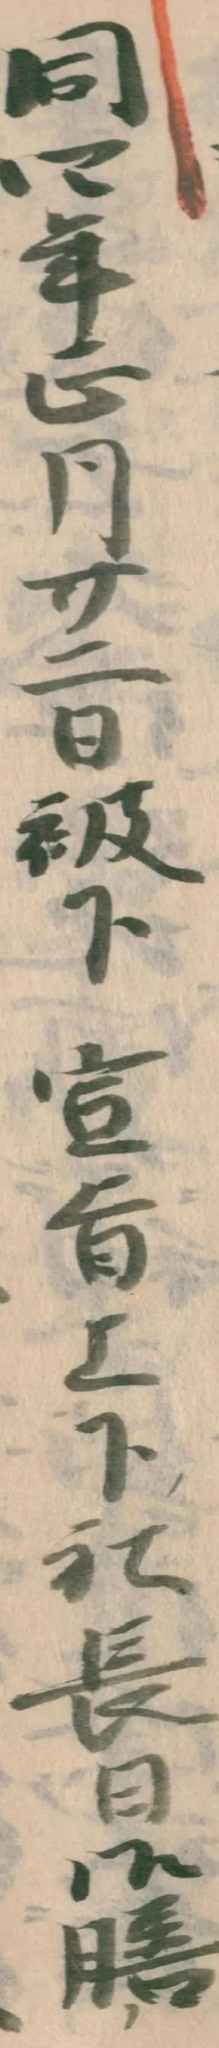同四年正月廿二日被下宣旨上下社長日御膳-
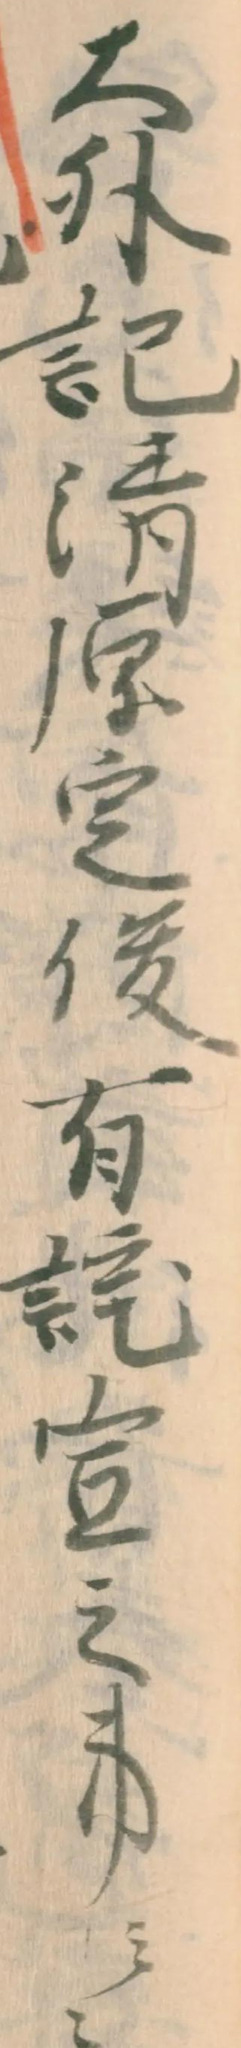大外記清原定後有詫宣之事云々
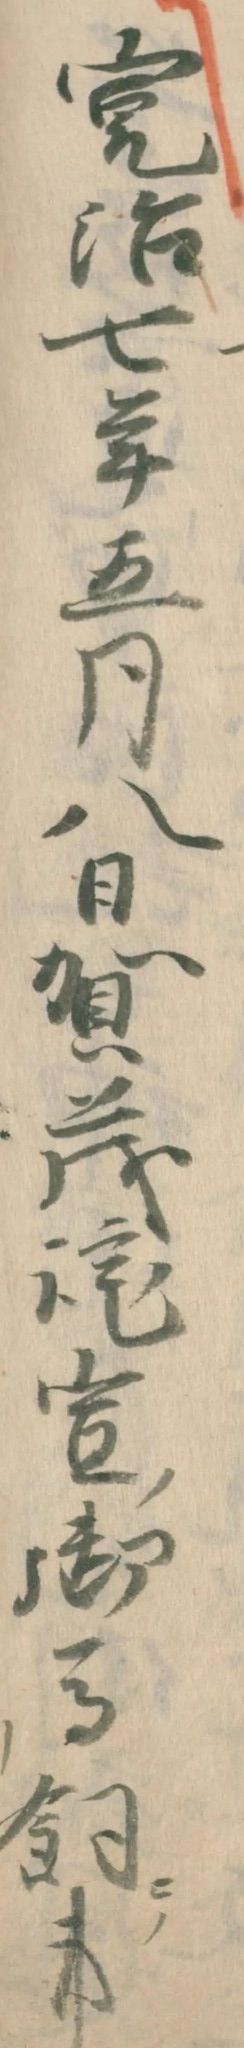寛治七年五月八日賀茂詫宣御馬-飼事

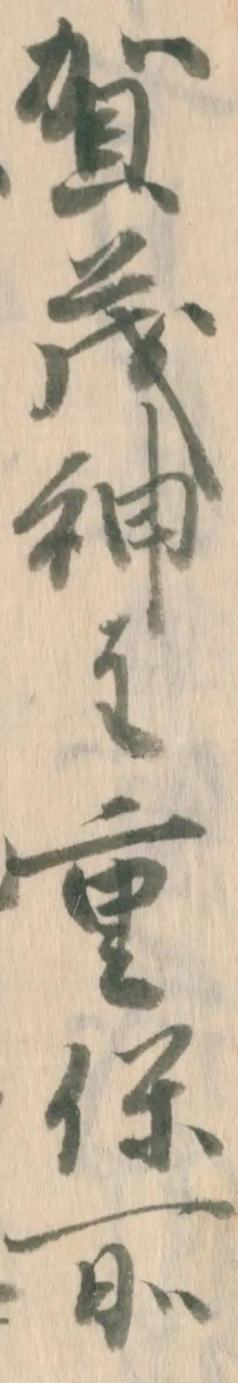下賀茂神主重保所
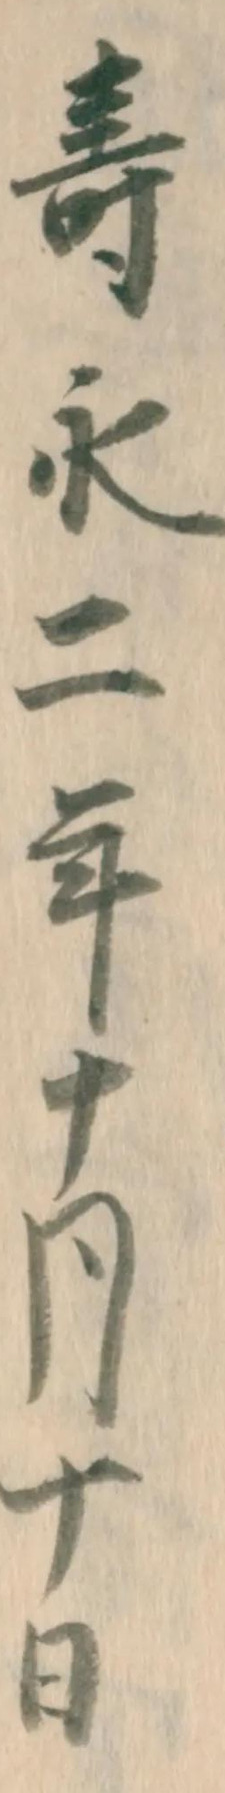寿永二年十月十日
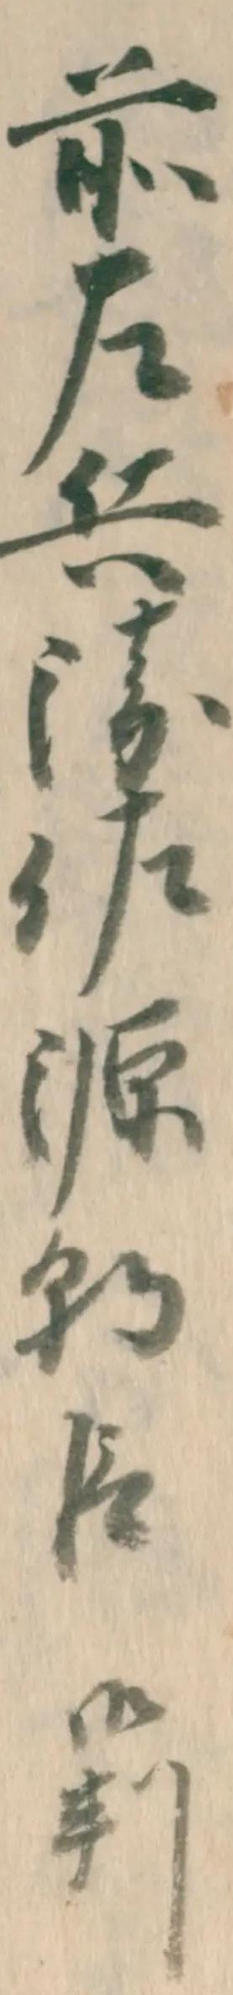前左兵衛佐源朝臣御判

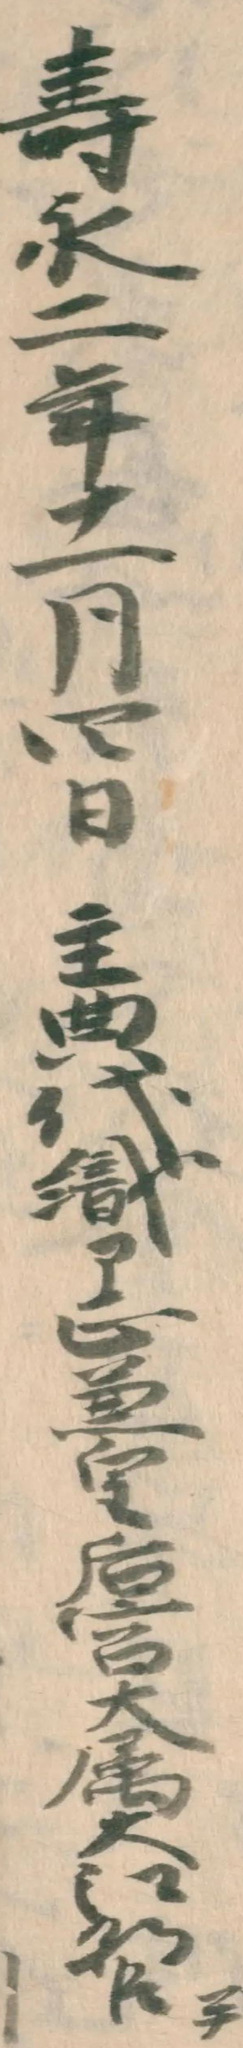寿永二年十一月四日主典代織部正兼皇后宮大属大江朝臣判
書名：賀茂社記録. 第1冊
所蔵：国立国会図書館 National Diet Library, JAPAN
